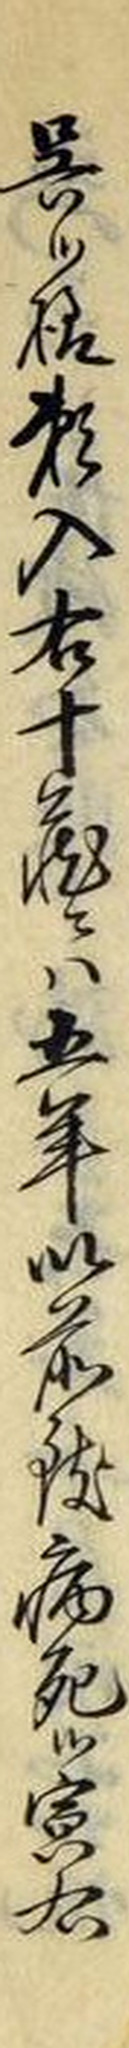呉候様頼入右十蔵にハ五年以前致病死候寅右

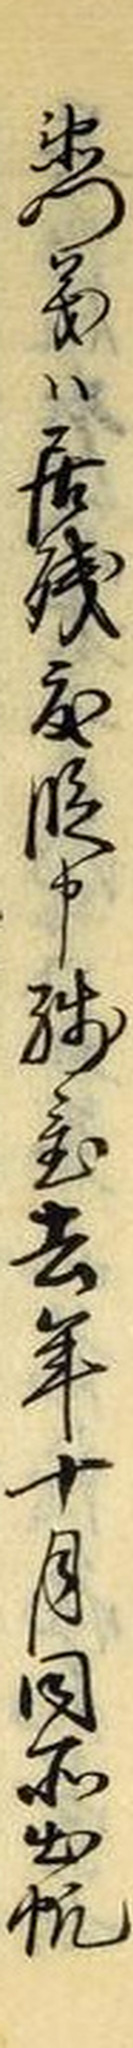衛門義ハ居残度段申残置去年十月同所出帆
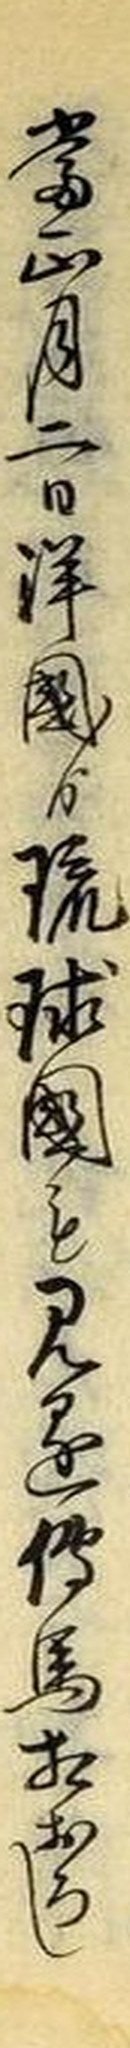当正月二日洋国ゟ琉球国も見通伝馬相おろし
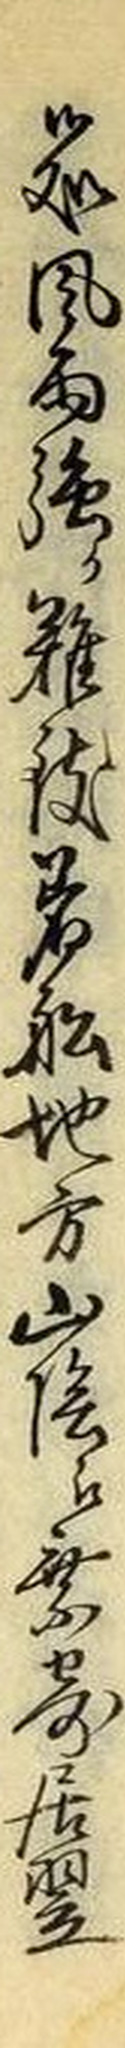候処風雨強く難致着船地方山陰え乗寄居翌
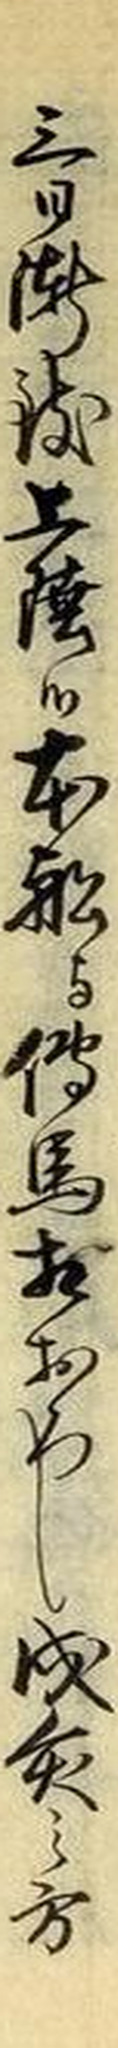三日漸致上陸候本船と伝馬相おろし戌亥之方
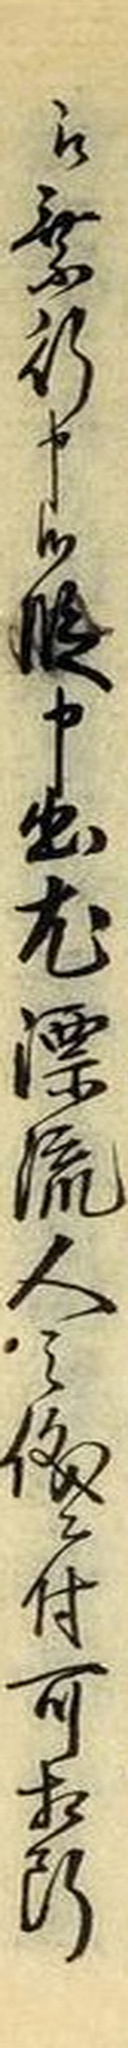え乗行申候段申出尤漂流人之儀に付可相断
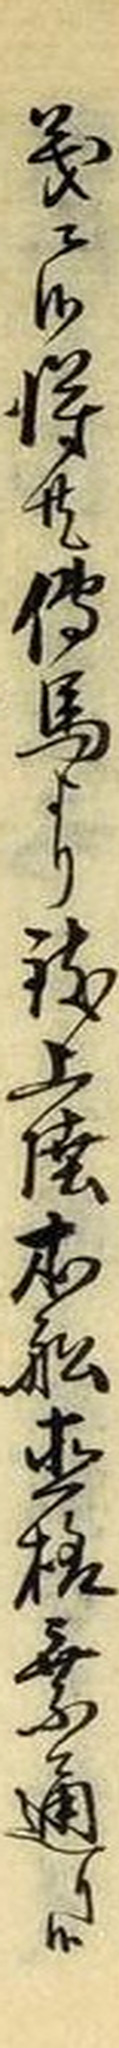義に候得共伝馬より致上本船直格乗通り候
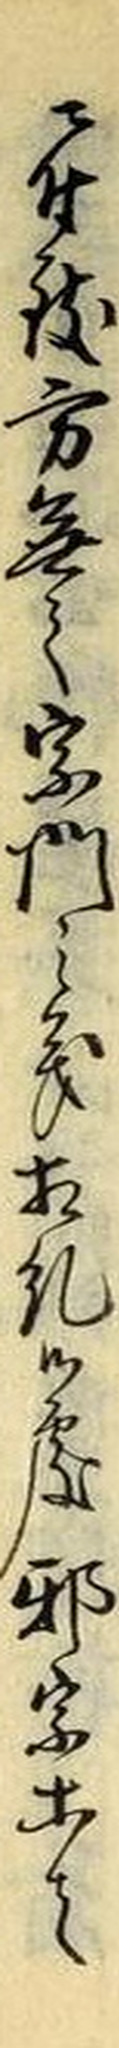に付致方無之宗門之義相糺候處邪宗等之
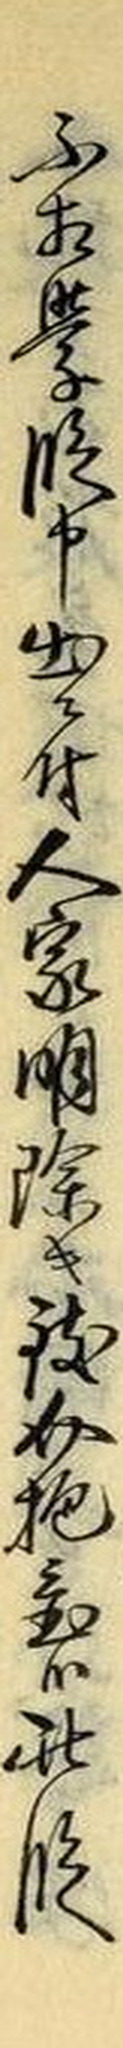不相学段申出に付人家明除き致介抱置候此段
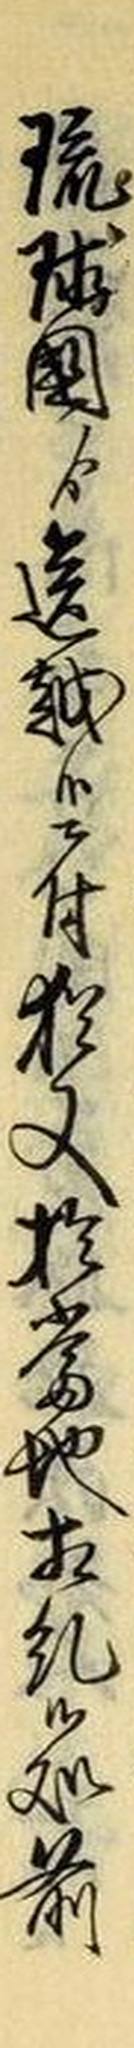琉球国ゟ送越候に付猶又於当地相糺候処前
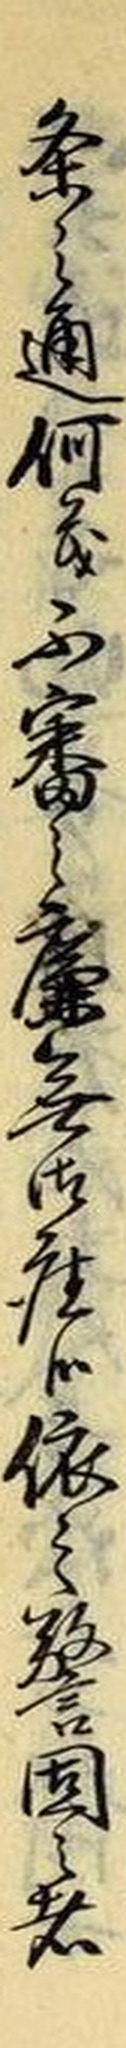条之通何も不審之處無御座候依之警護之者
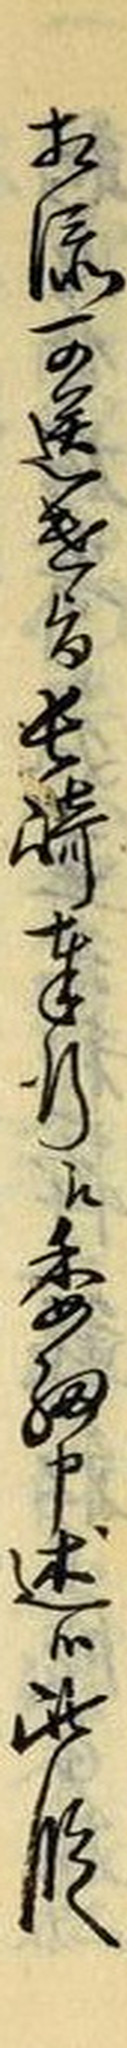相添可送遣旨長崎奉行え委細申述候此段
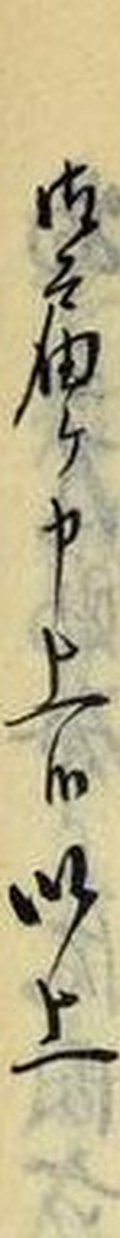御届ヶ申上候以上
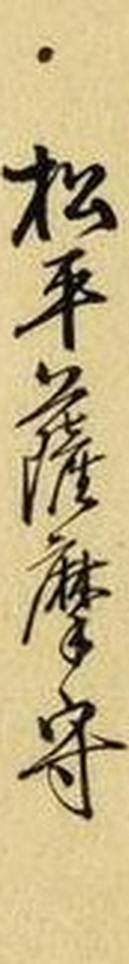松平薩摩守

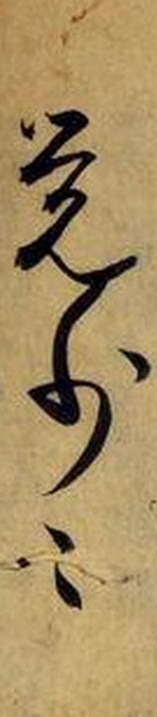覚少々
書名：漂客談奇（備考雑録写8）
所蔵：福井県文書館 Fukui Prefectural Archives
